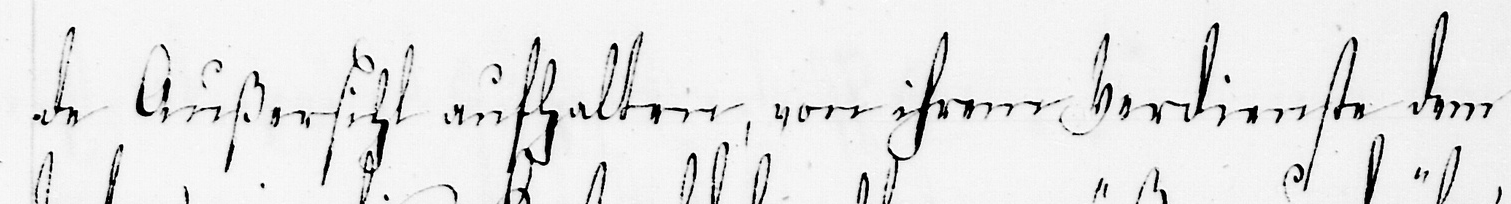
de Außersihl aufhalten, von ihrem Verdienste dem
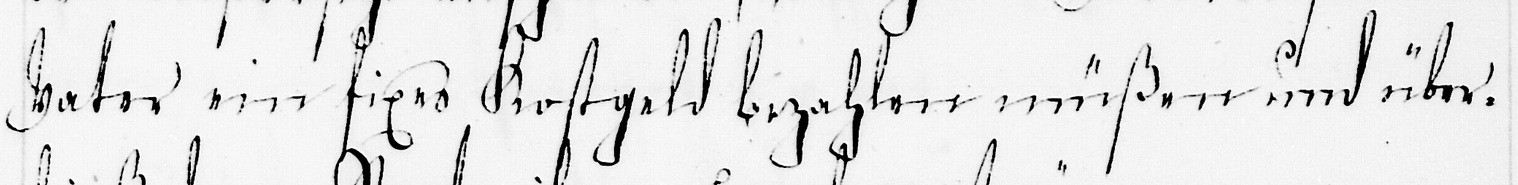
Vater ein fixes Kostgeld bezahlen müßen und über¬
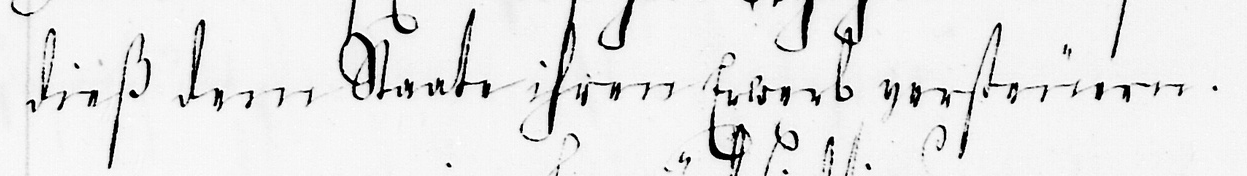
dieß dem Staate ihren Erwerb versteuern.
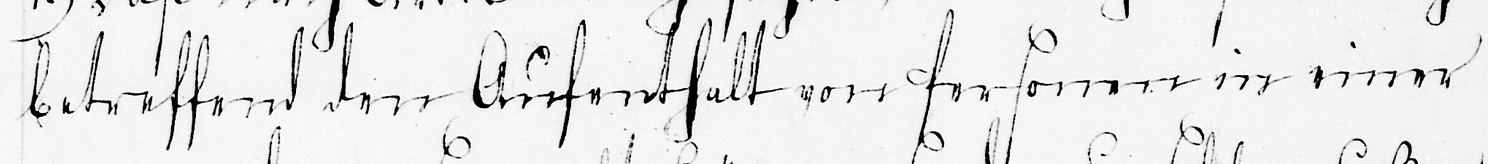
betreffend den Aufenthalt von Personen in einer
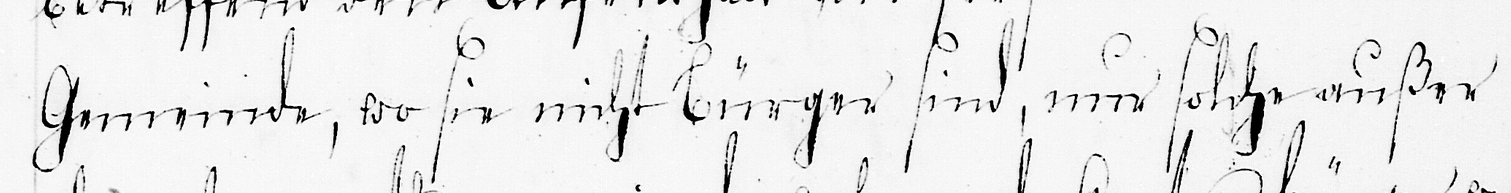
Gemeinde, wo sie nicht Bürger sind, nur solche außer
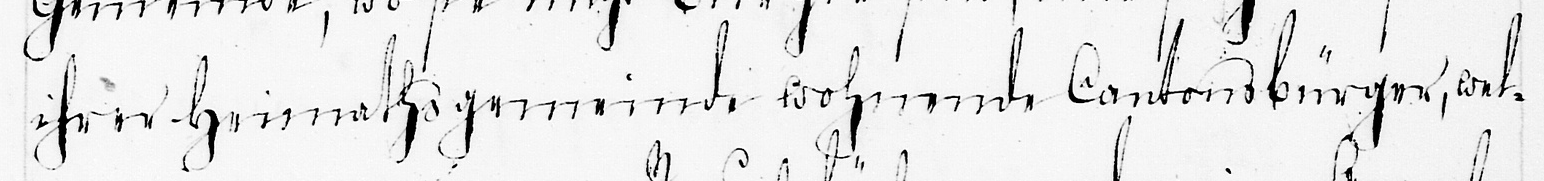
ihrer Heimathsgemeinde wohnende Cantonsbürger, wel¬
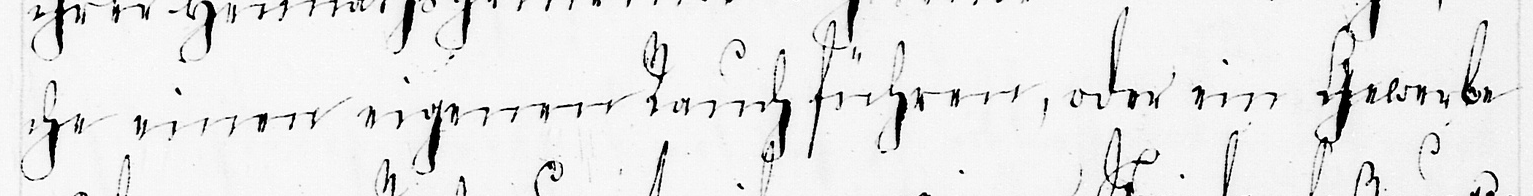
che einen eigenen Rauch führen, oder ein Gewerbe
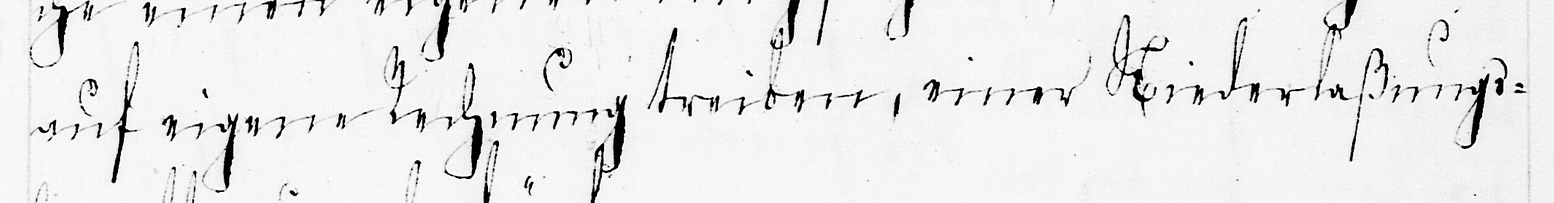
auf eigene Rechnung treiben, einer Niederlaßungs¬
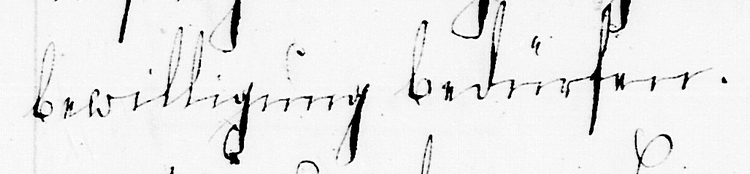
bewilligung bedürfen.
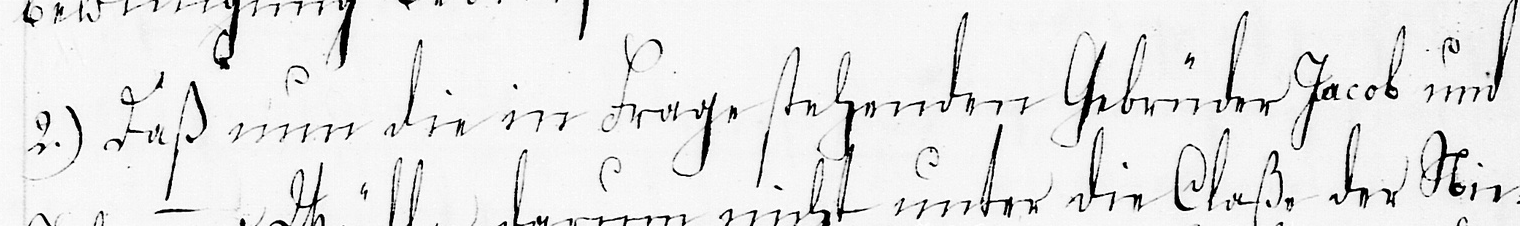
2.) Daß nun die in Frage stehenden Gebrüder Jacob und
